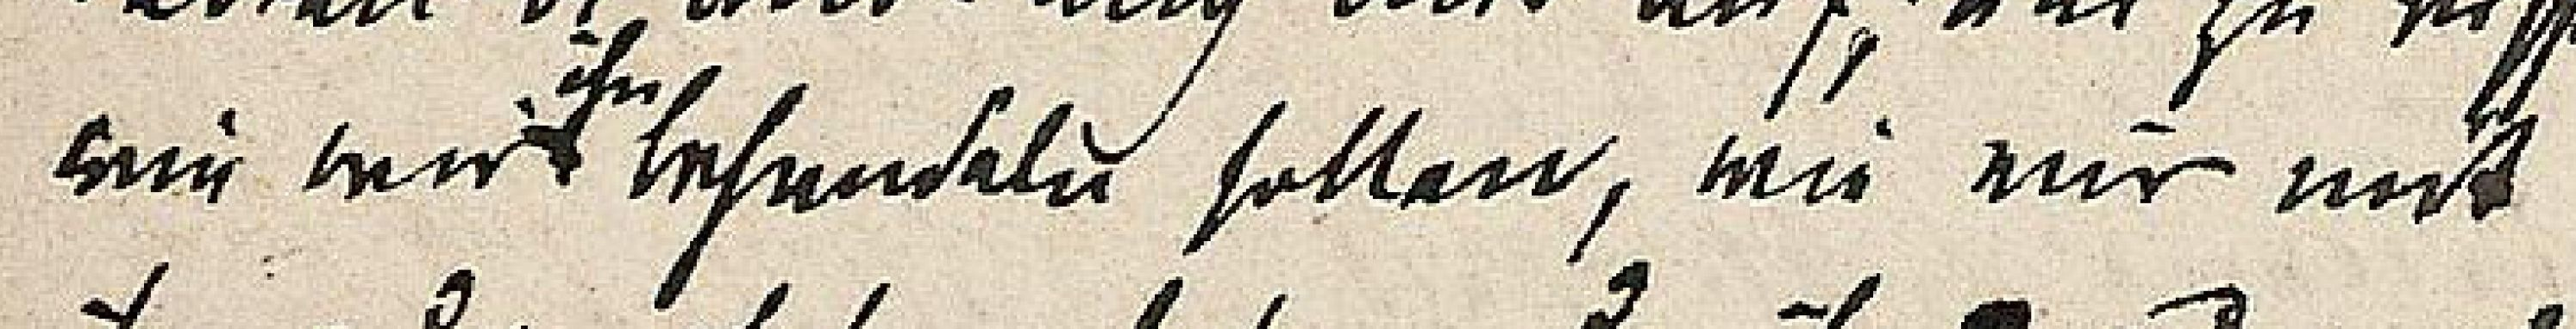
wie wir ihn behandelt sollen, wie wir mit
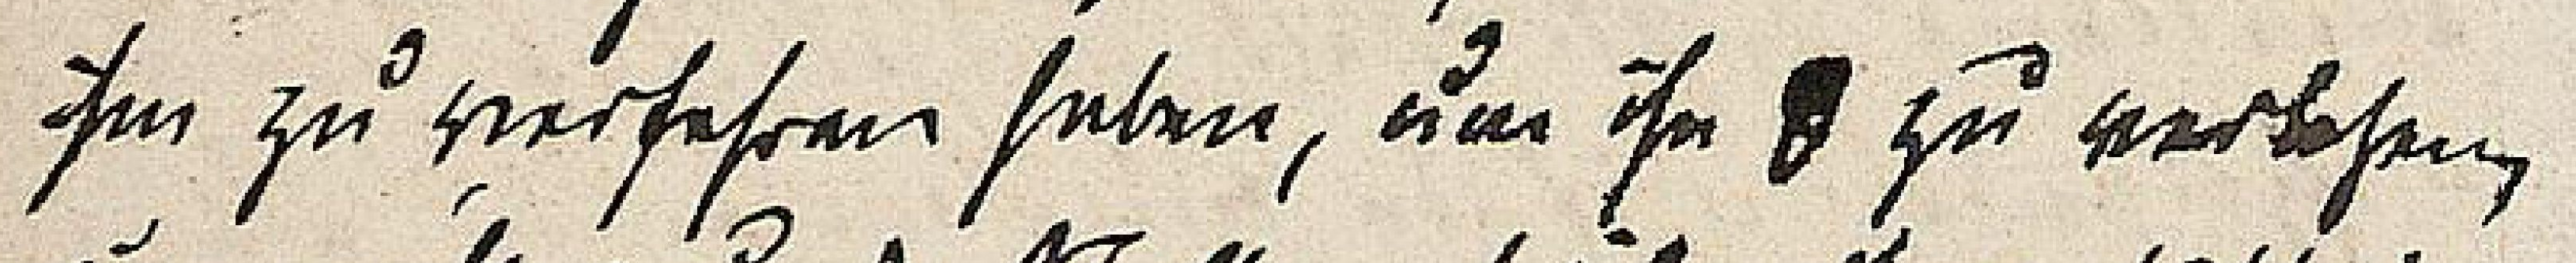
ihm zu verfahren haben, um ihn o zu verletzen,
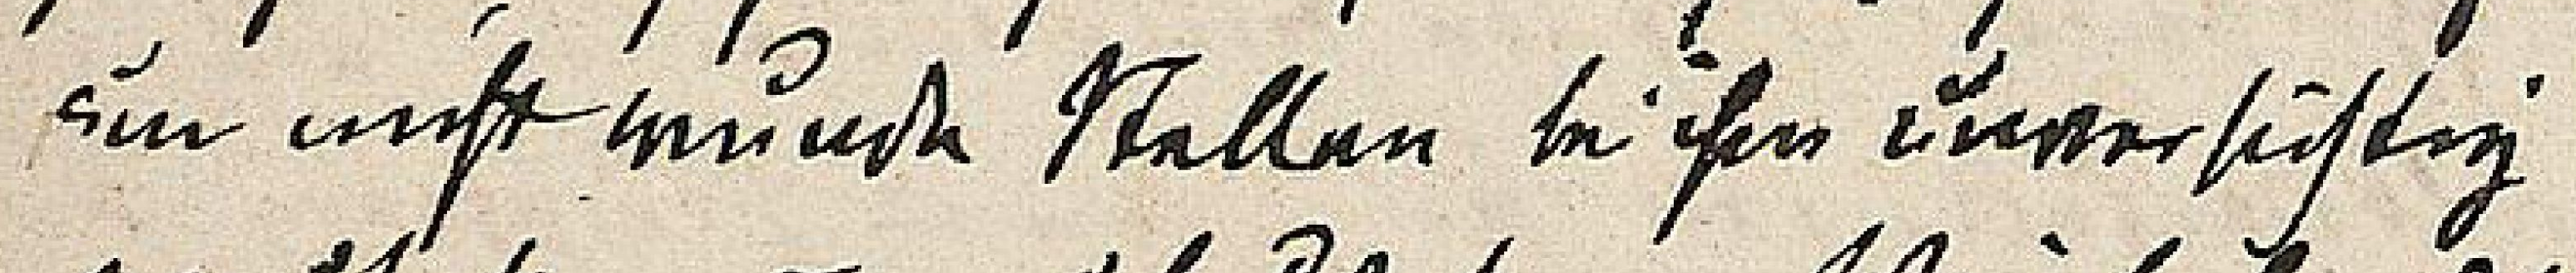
um nicht wunde Stellen bei ihm unvorsichtig
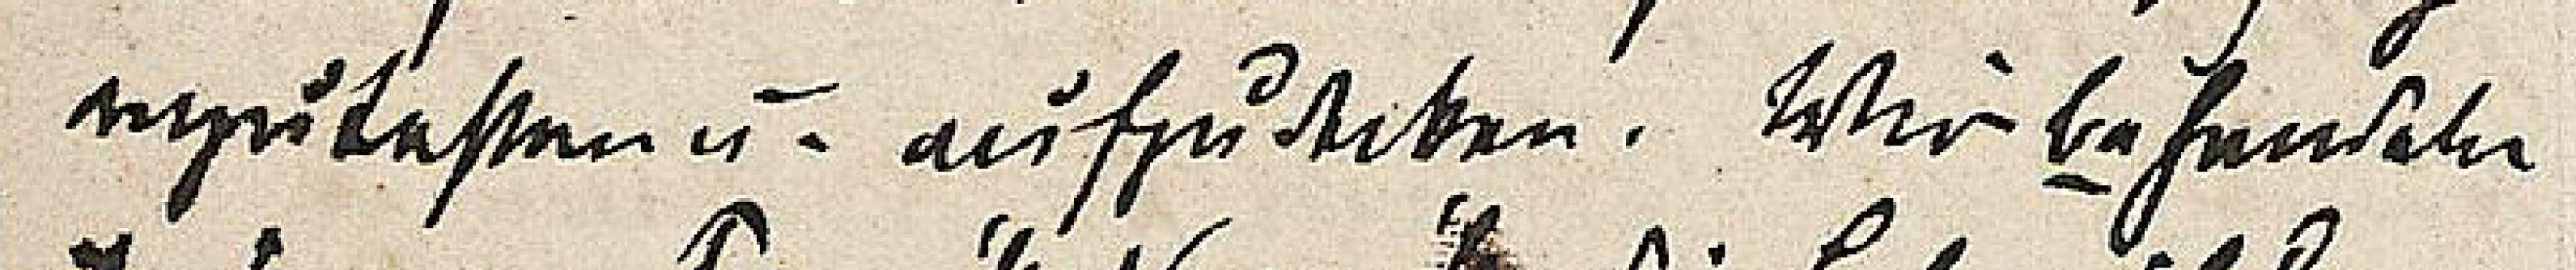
anzutasten u. aufzudecken. Wir behandeln
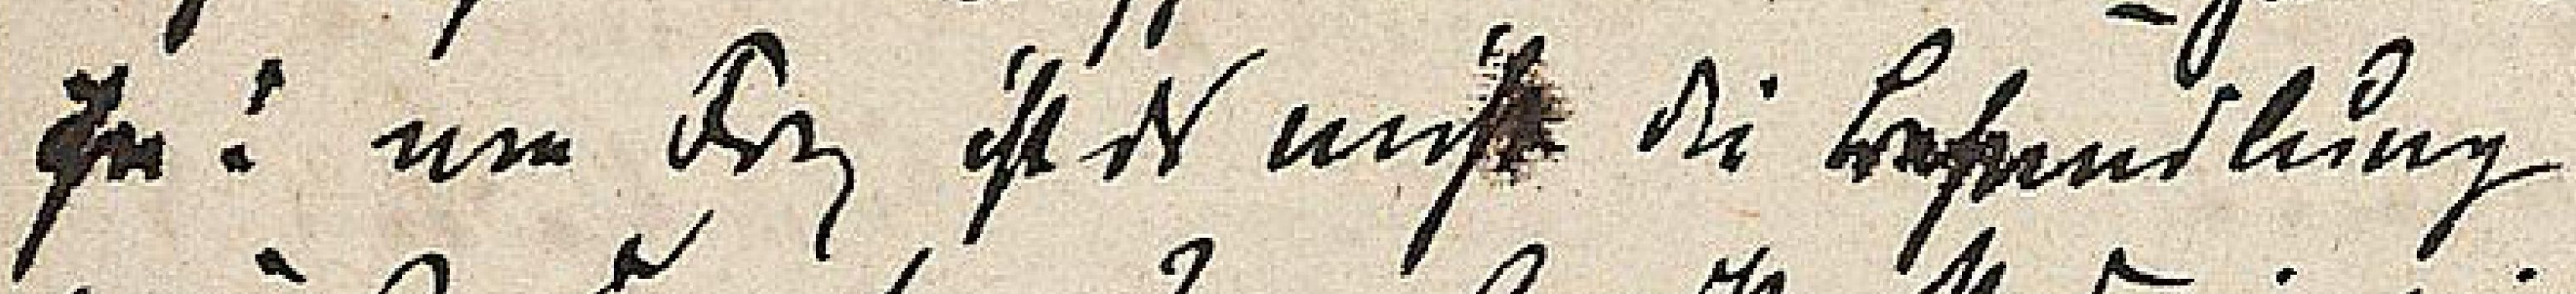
ihn! m Fr, ist ds nicht die Behandlung
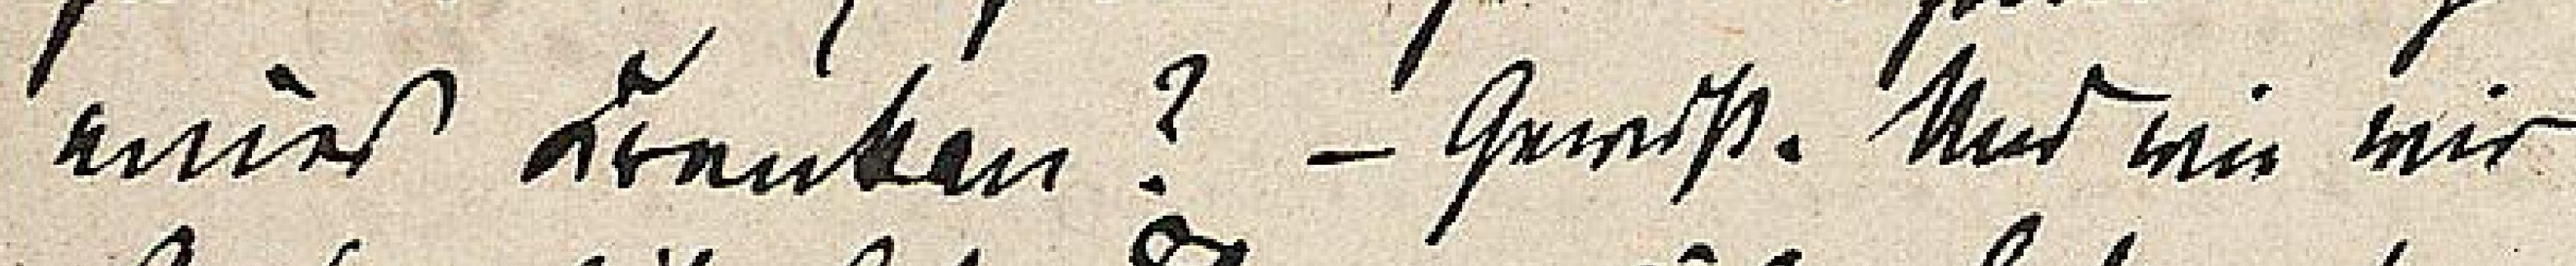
eines Kranken? _ Gewiß. Und wie wir
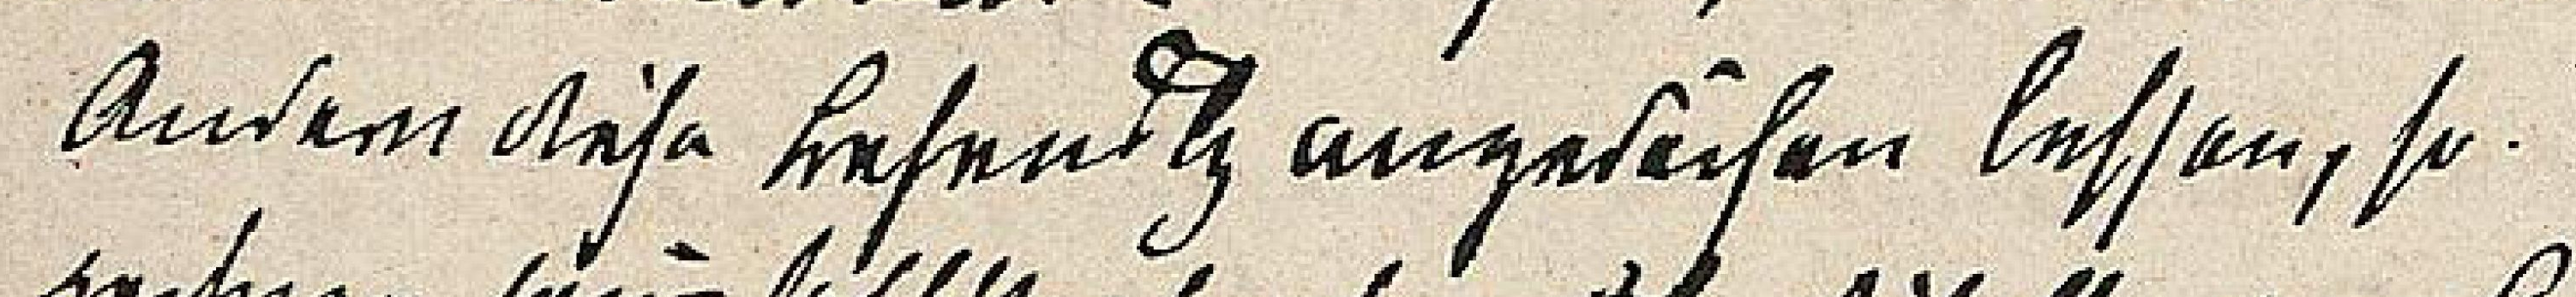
Andern diese Behandlg angedeihen lassen, so
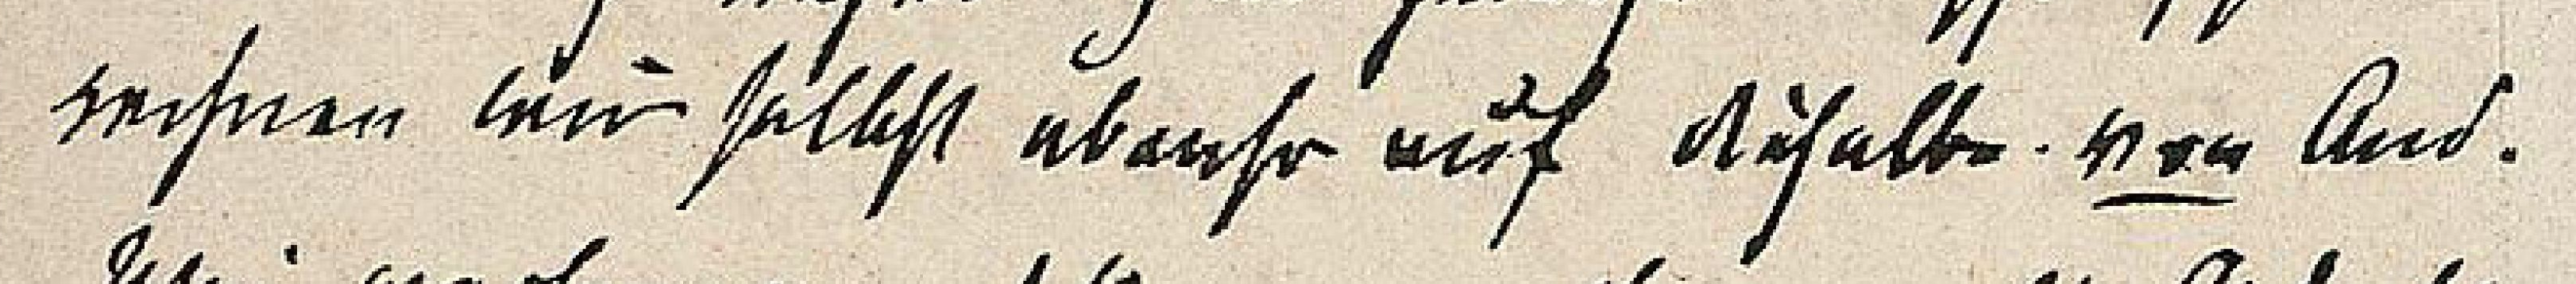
rechnen wir selbst ebenso auf dieselbe von And.
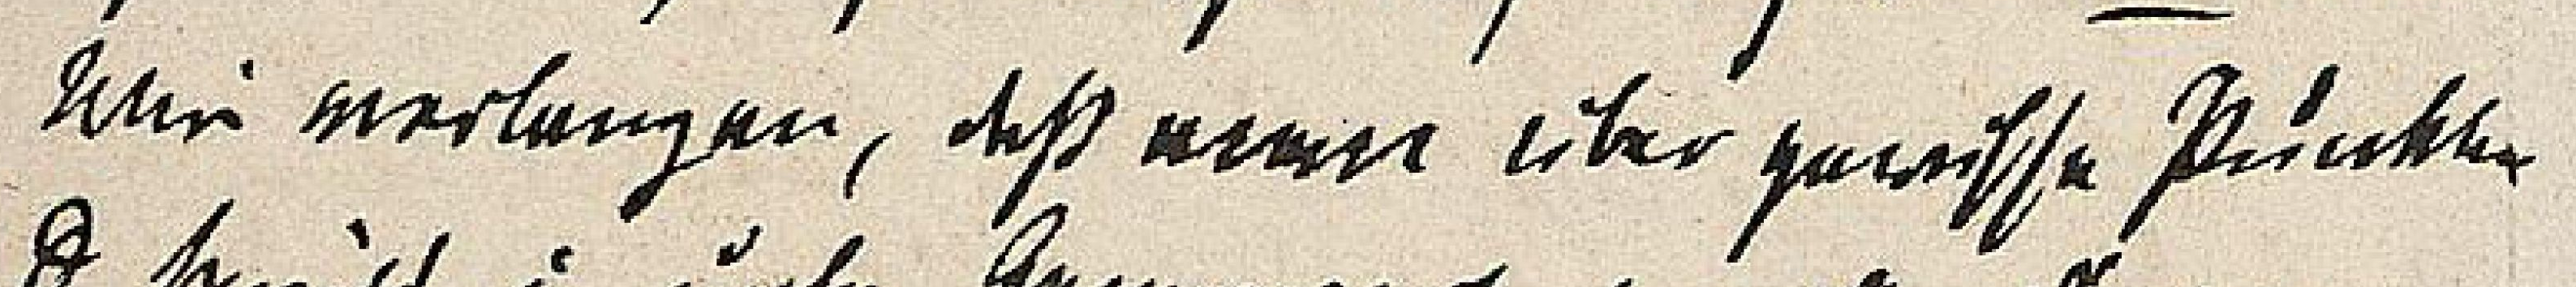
Wir verlangen, daß man über gewisse Punkte.
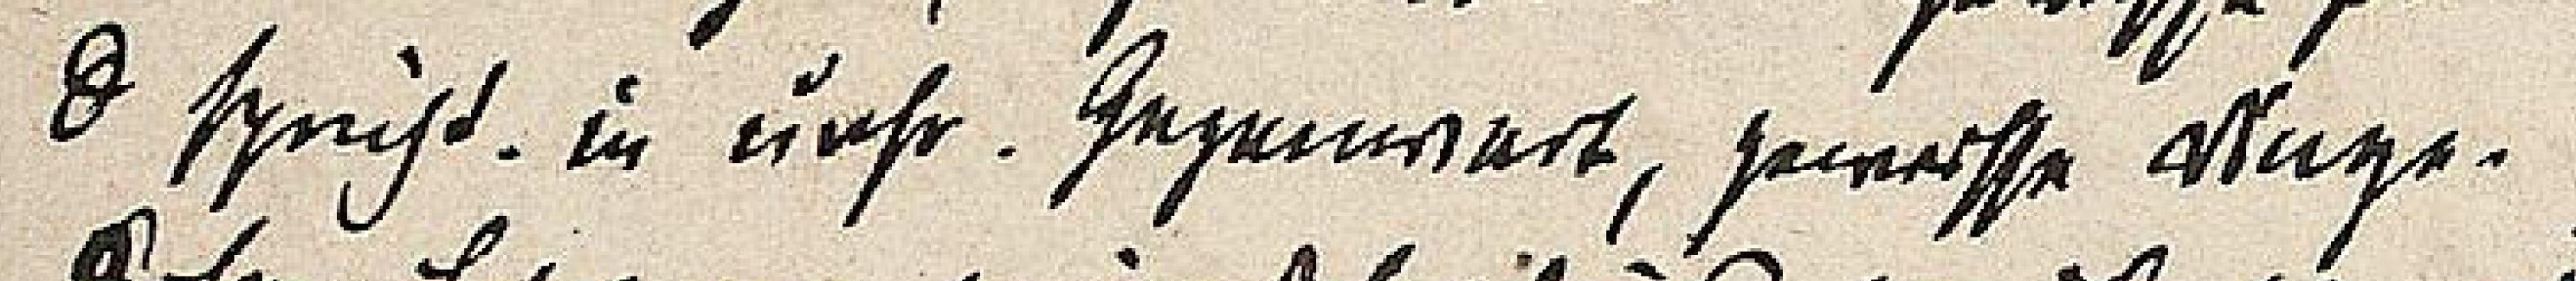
o spricht. in unsr. Gegenwert, gewisse Dinge.
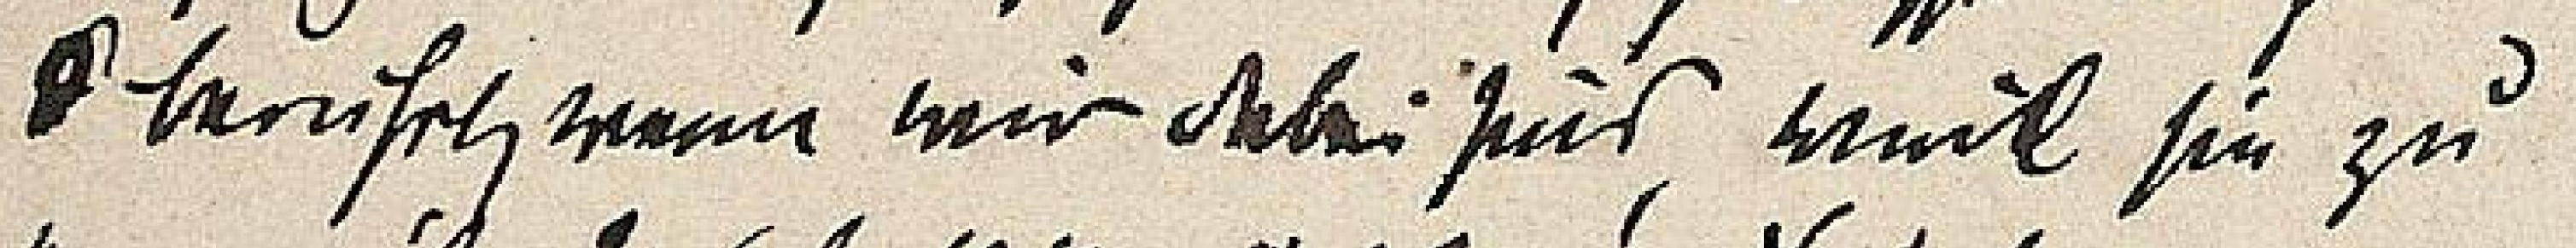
o berührt, wenn wir dabei sind, weil sie zu
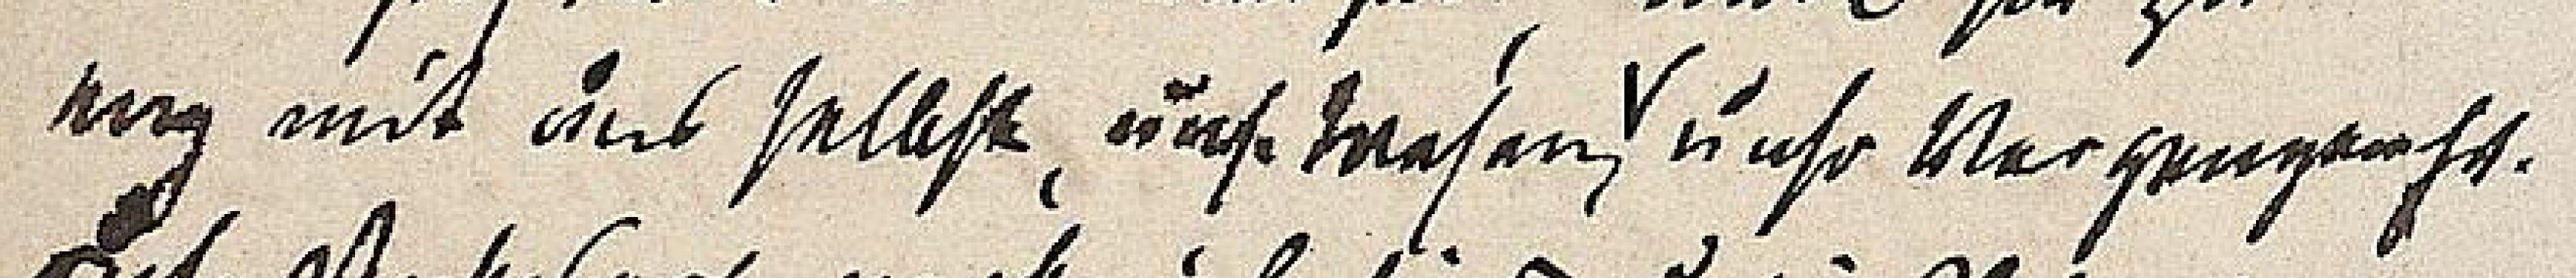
eng mit uns selbst, unsr Wesen, V unsr Vergangenht.
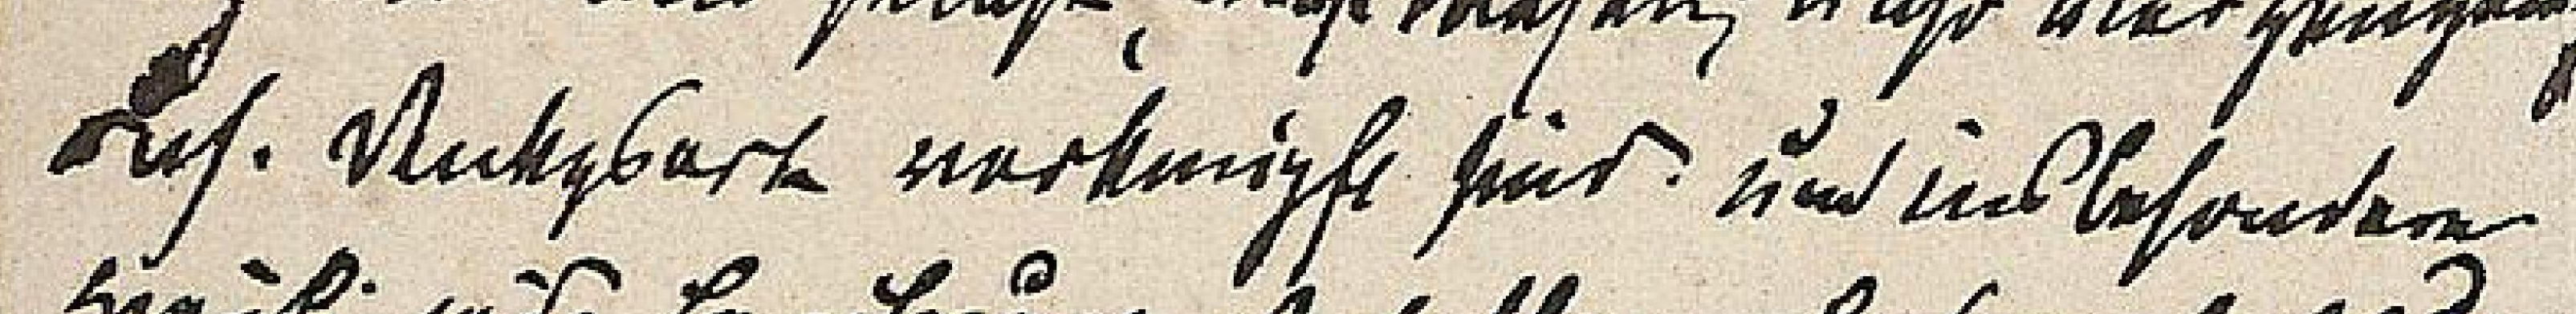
uns.. Denkgsart verknüpft sind. und insbesondere
